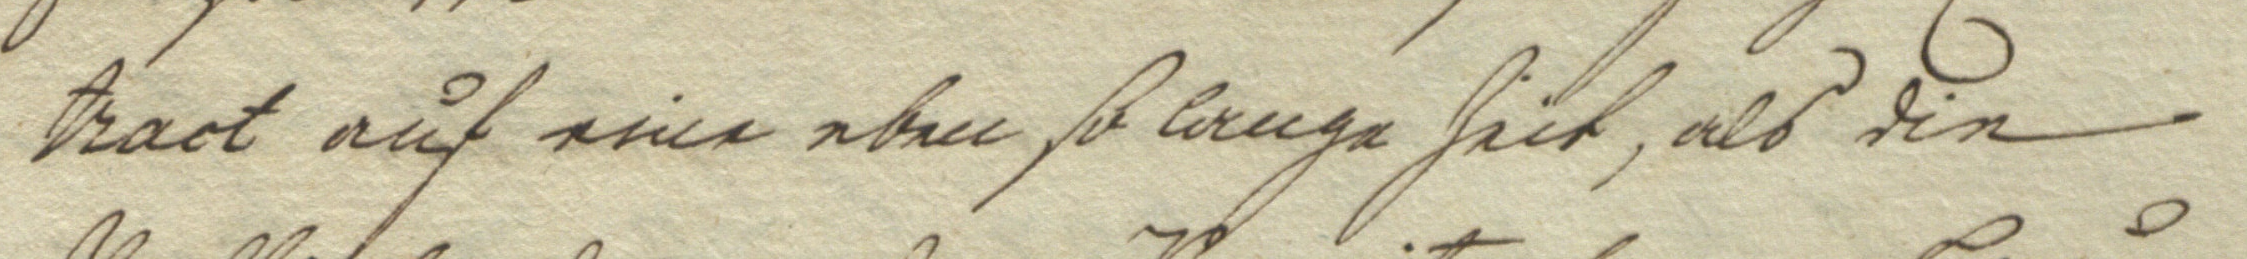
tract auf eine eben so lange Zeit, als die
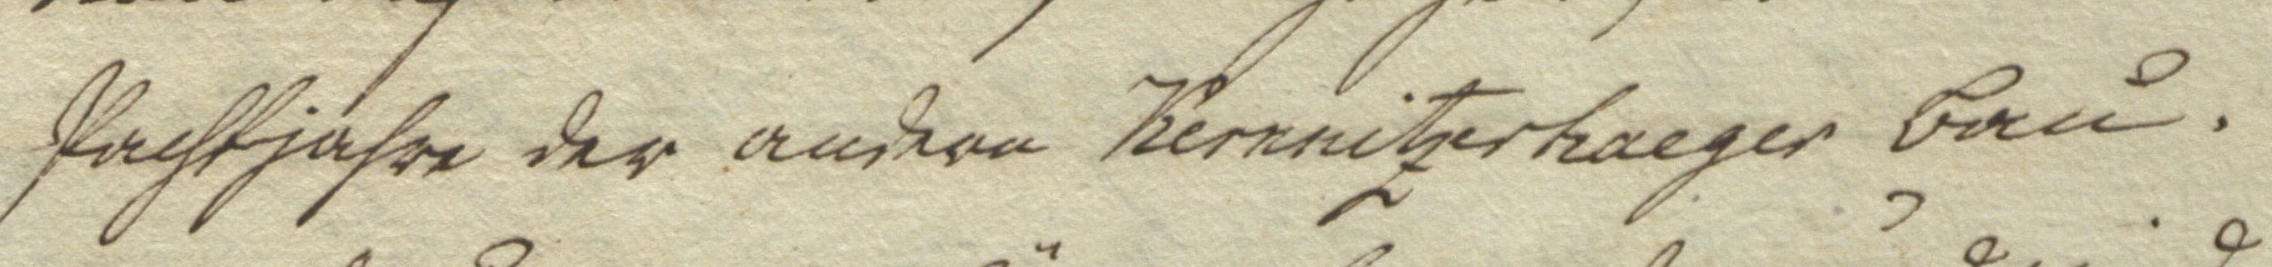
Pachtjahre der andern Kemnitzerhaeger Bau¬
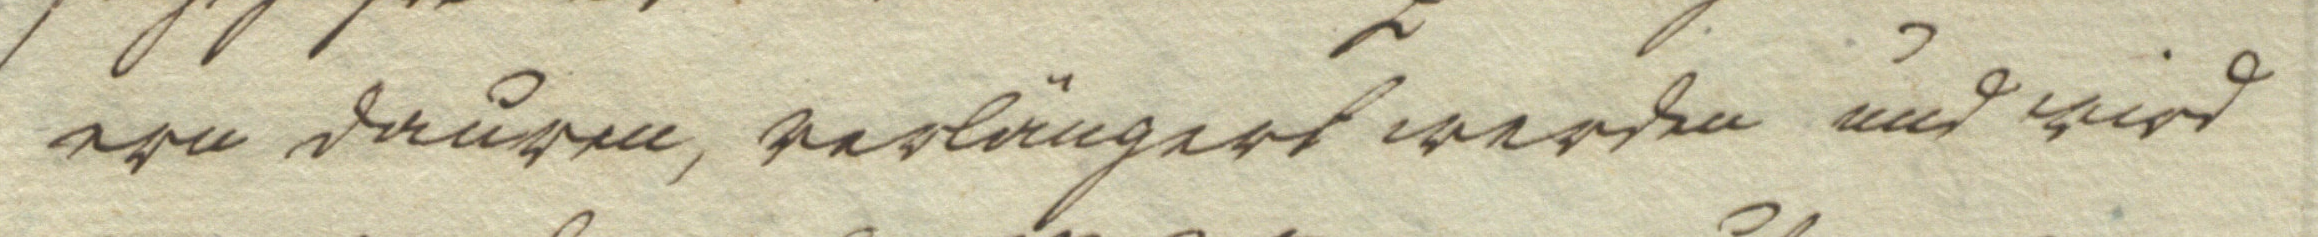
ern dauren, verlängert werden und wird
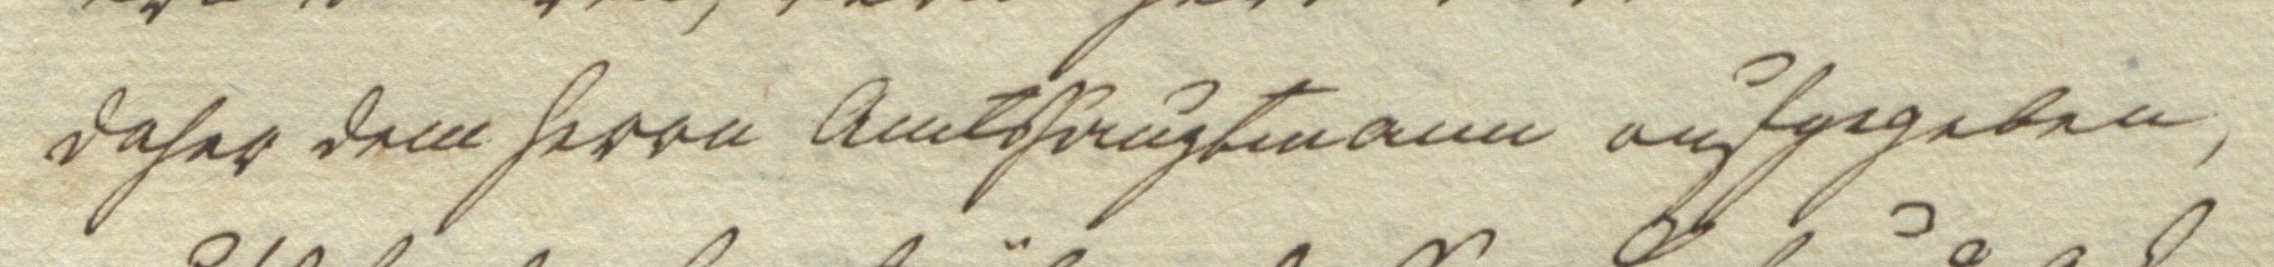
daher dem Herrn Amtshauptmann aufgegeben,
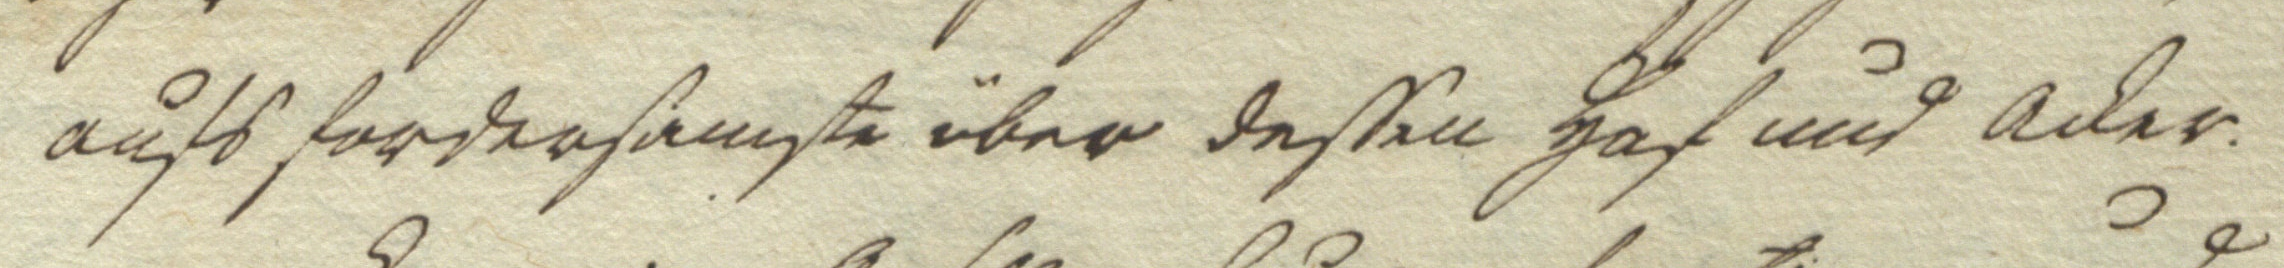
aufs fordersamste über dessen Hof und Acker¬
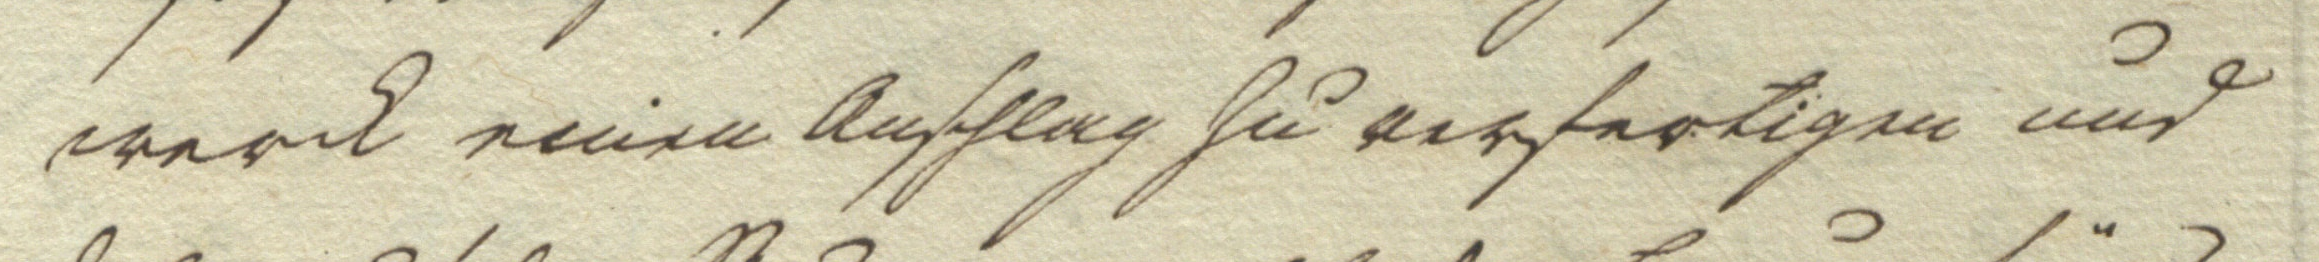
werck einen Anschlag zu verfertigen und
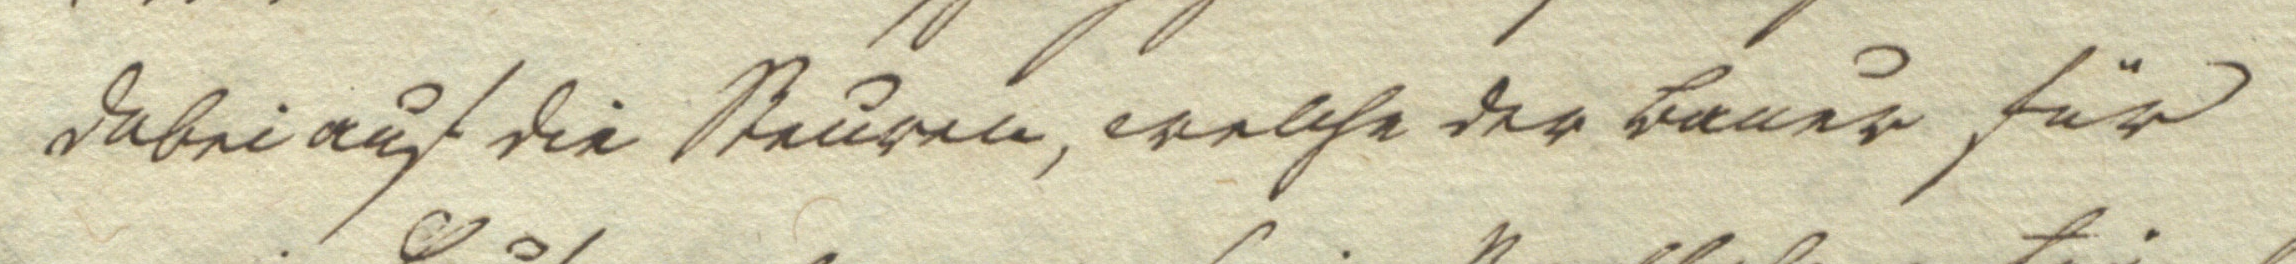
dabei auf die Steuren, welche der Bauer für
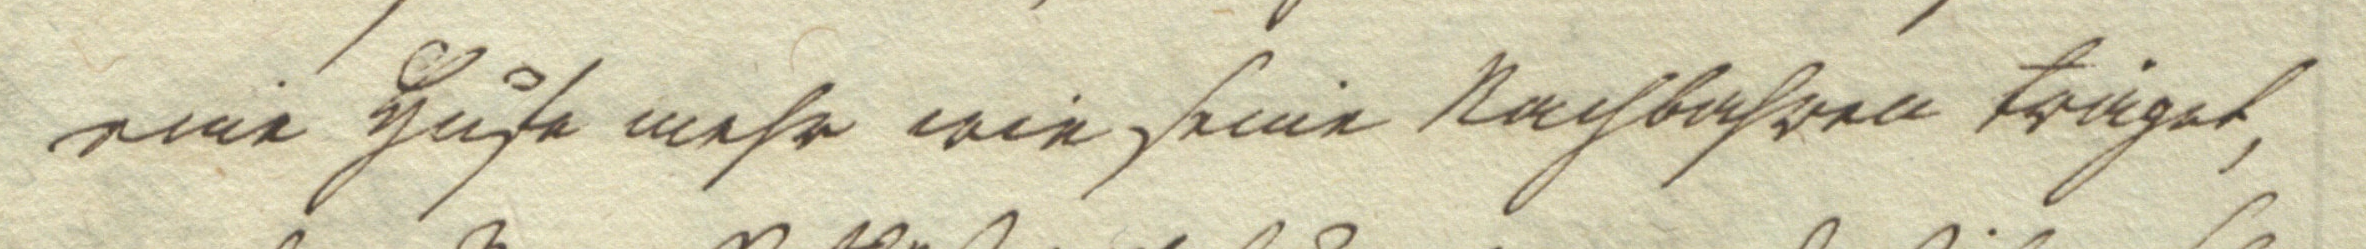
eine Hufe mehr wie seine Nachbahren träget
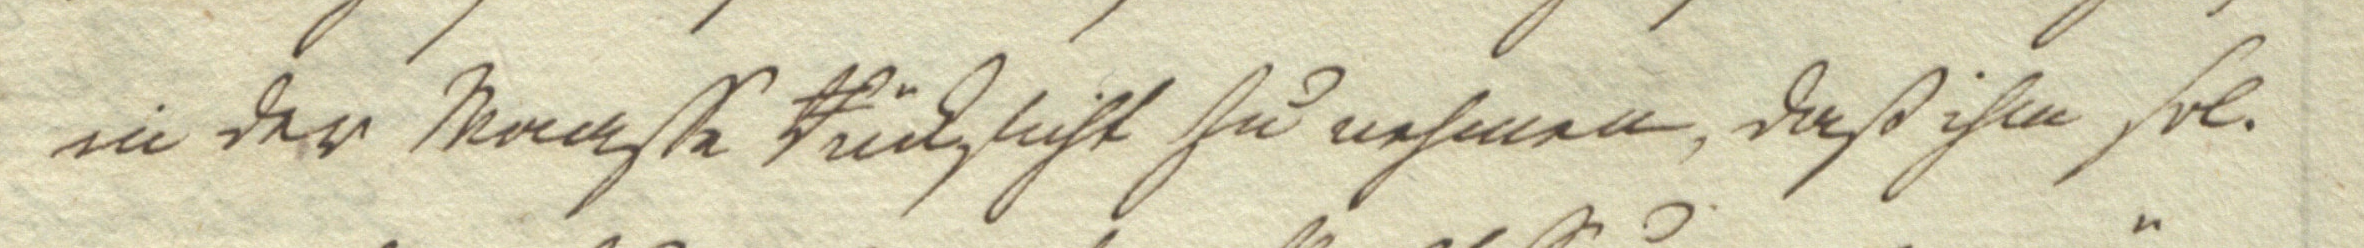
in der Maasse Rücksicht zu nehmen, daß ihm sol¬
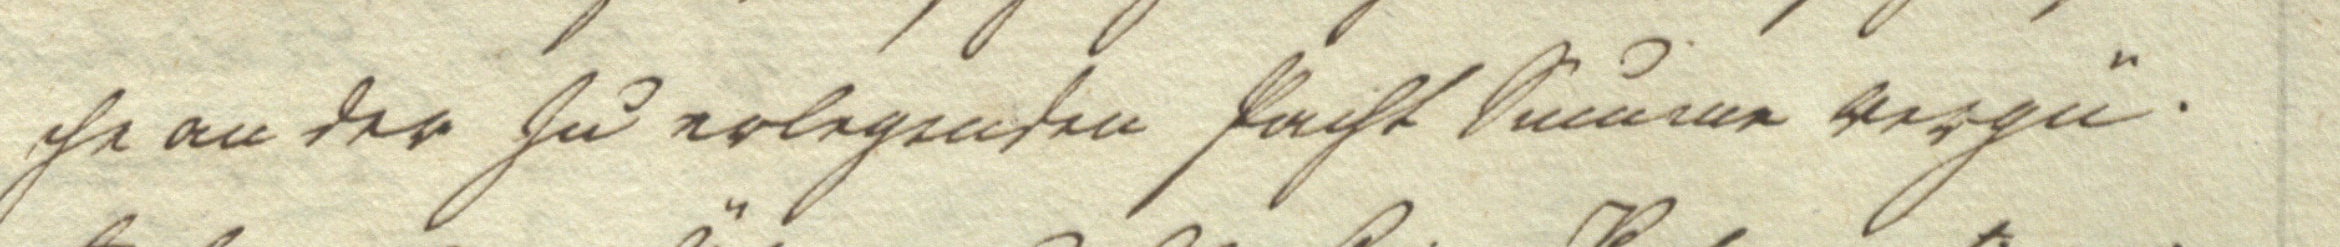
che an der zu erlegenden Pacht Summe vergü¬
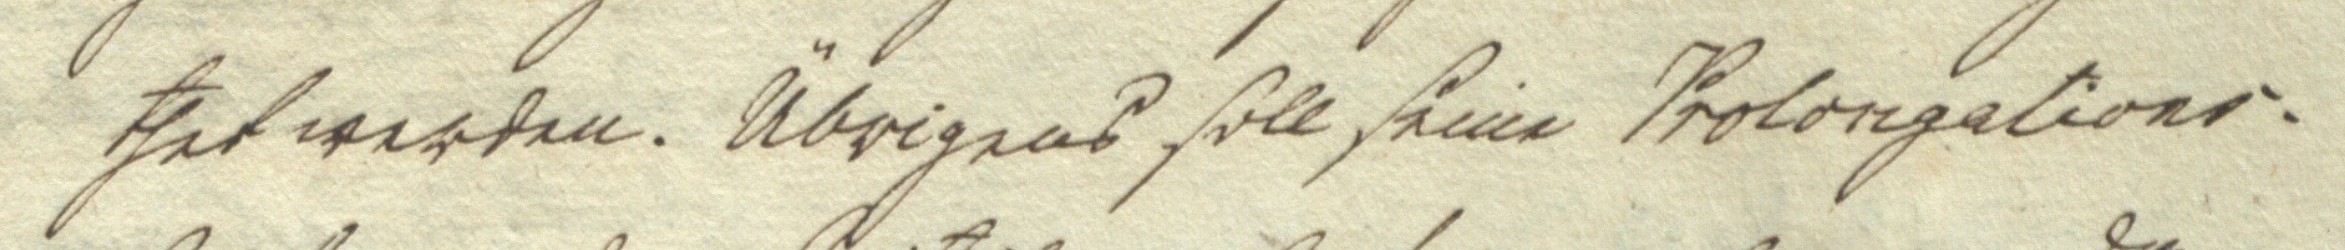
thet werden. Übrigens soll seine Prolongations¬
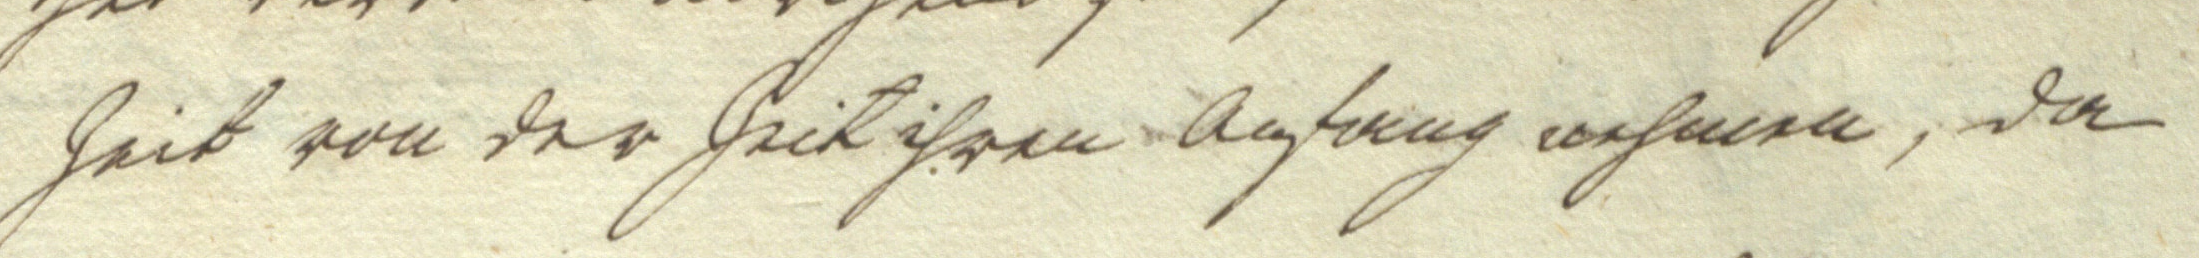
Zeit von der Zeit ihren Anfang nehmen, da
